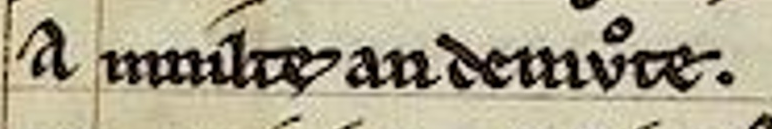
Anmilte an demv°ote.
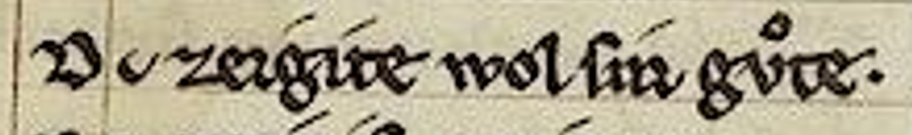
D(az) zeigite wol ſin gv°ote.
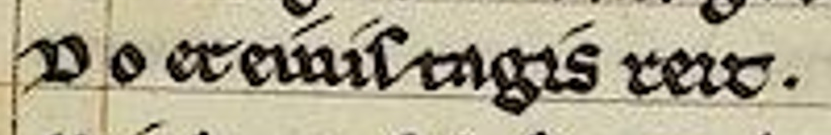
Do er einiſ tagiſ reit.
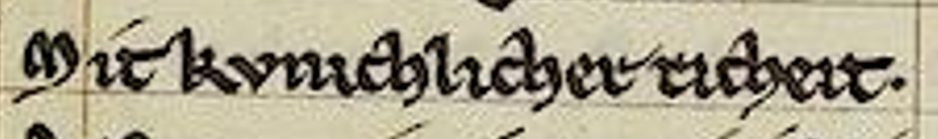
Mit kvnichlicher richeit.
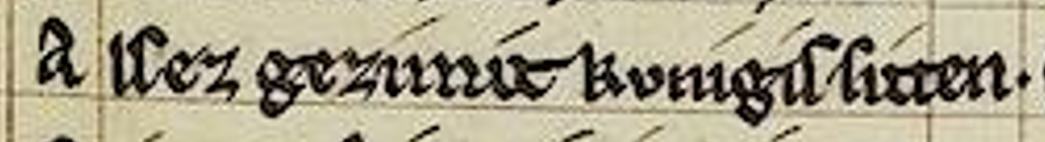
Alſez gezimit kvnigiſ ſitten.
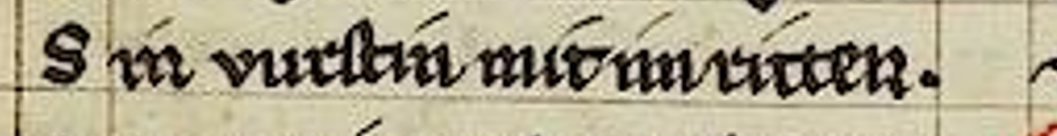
Sin vurſtin mit im ritten.
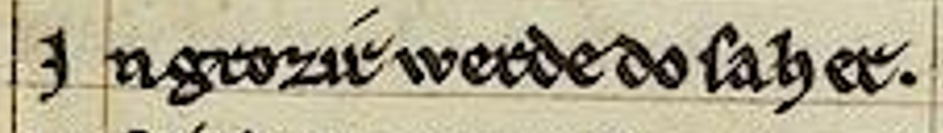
In grozir werde do ſah er.
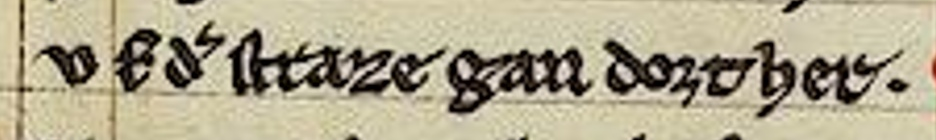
Vf d(er) ſtraze ganz dort her.
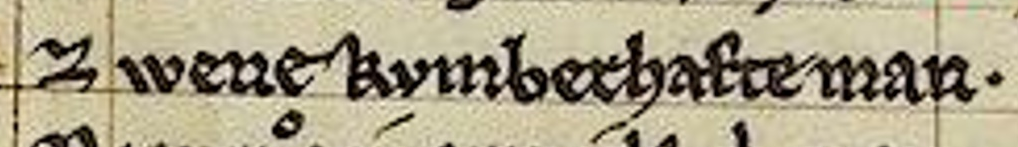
Zwene kvmberhafte man.
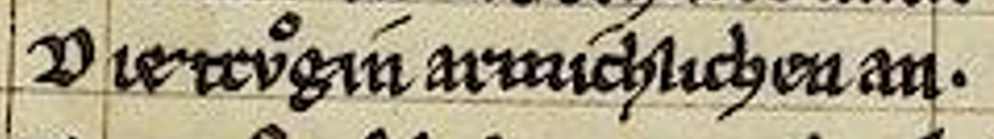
Die trv°ogin armichlichen an.
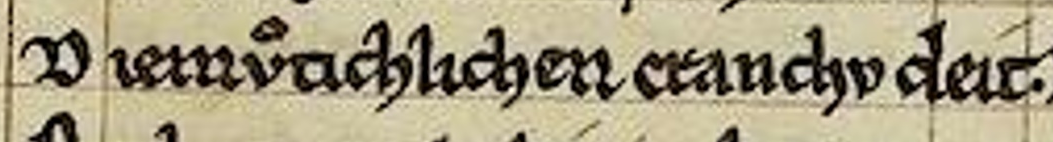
Diemv°otichlichen cranchv cleit.
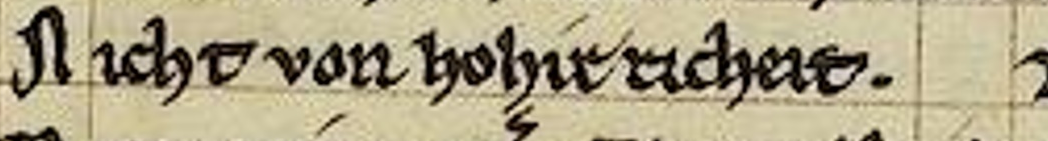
Nicht von hohir richeit.
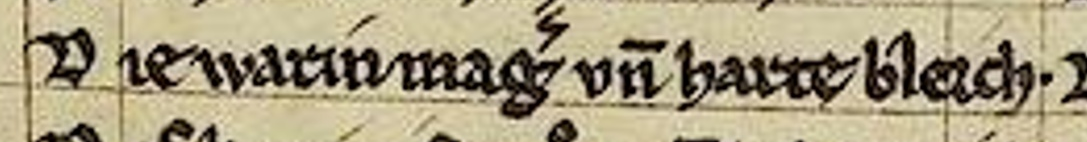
Die warin mag(er) vn(d) harte bleich.
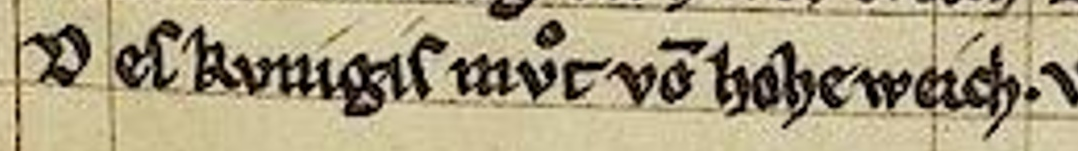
Deſ kvnigiſ mv°ot vo(n) hohe weich.
